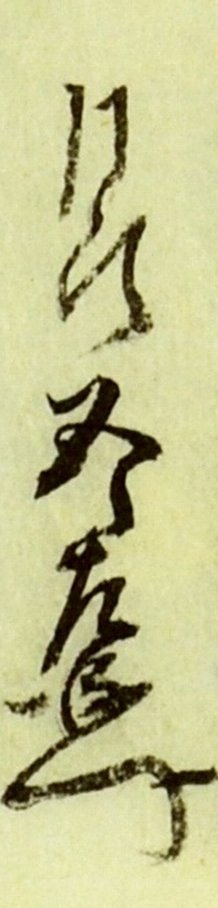組頭甚右衛門
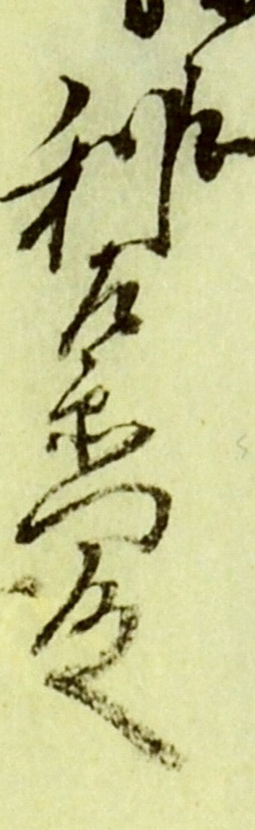利左衛門殿
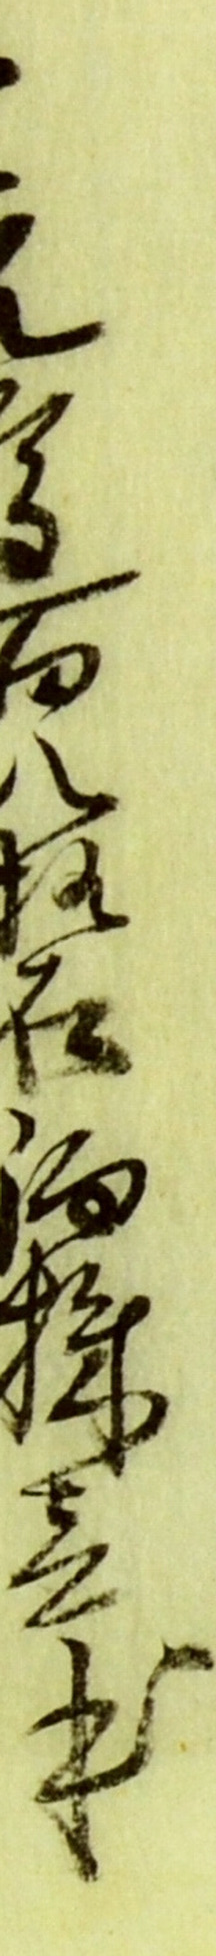一元高百八拾石酒株壱本

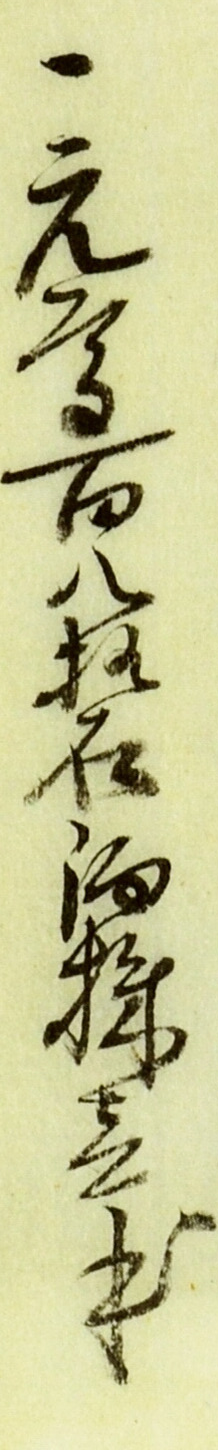一元高百八拾石酒株壱本
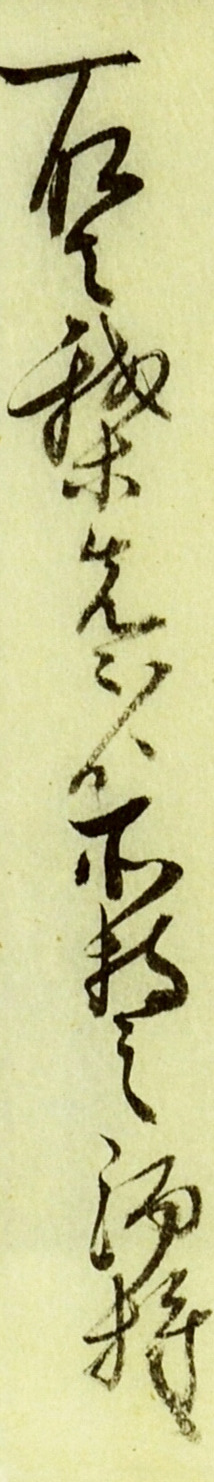石者我等先々ゟ所持之酒株
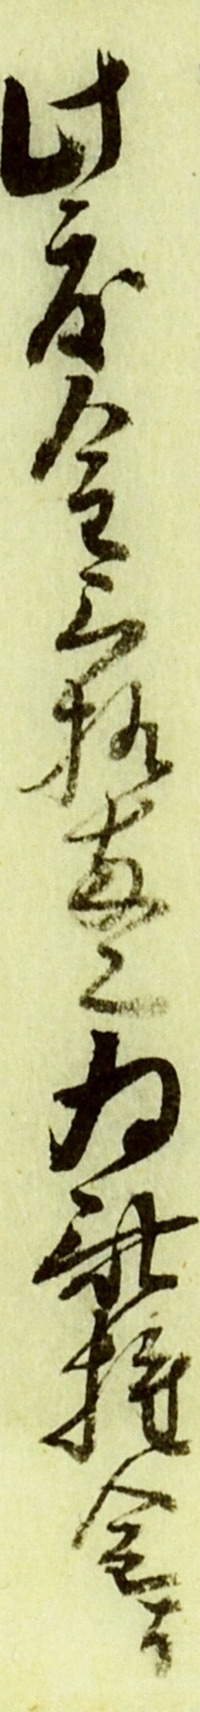此度金三拾両也為此株金と
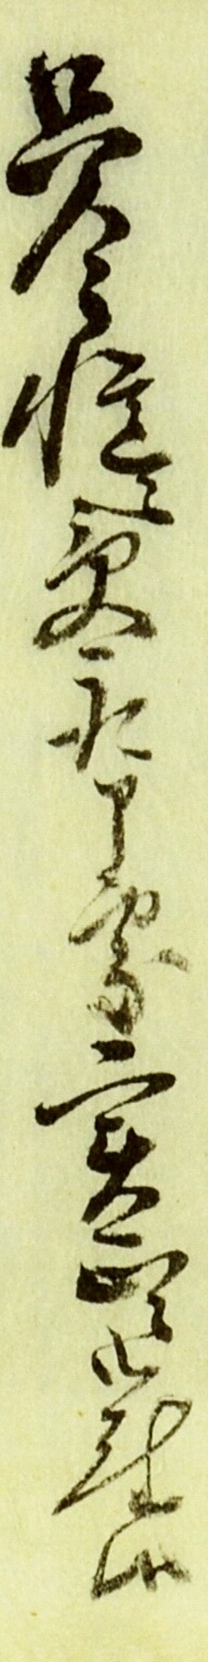只今慥ニ受取申処実正ニ御座候
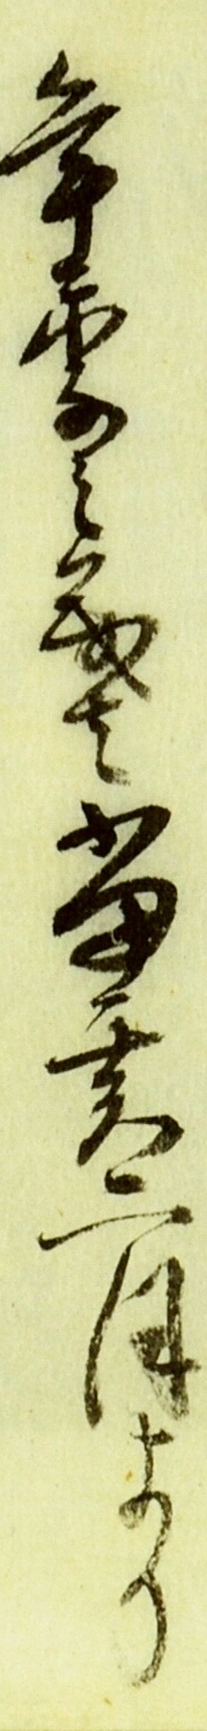年季之義羽者当亥二月より
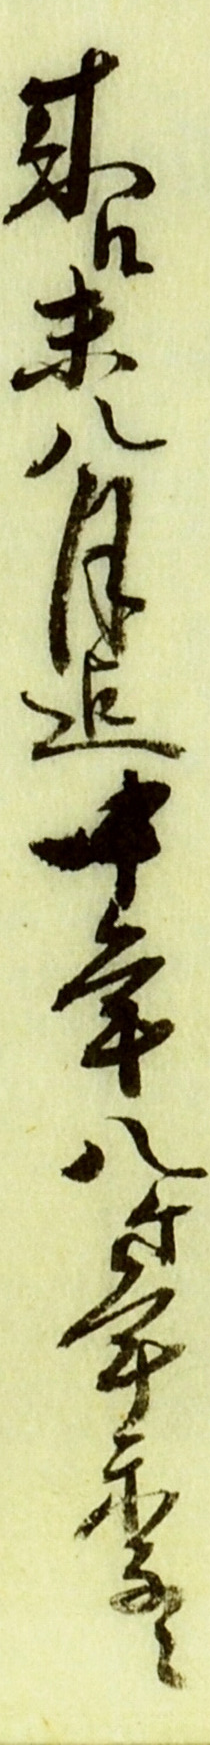来ル未八月迄中八ケ年季ニ
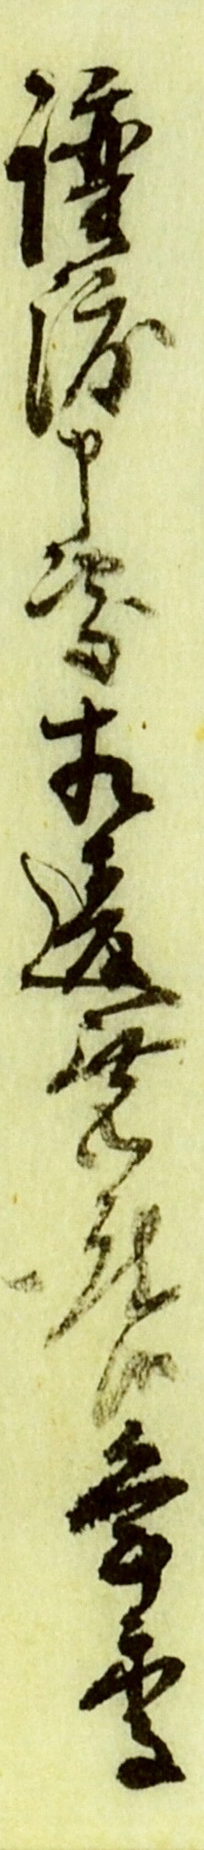譲渡申処相違無御座候年季
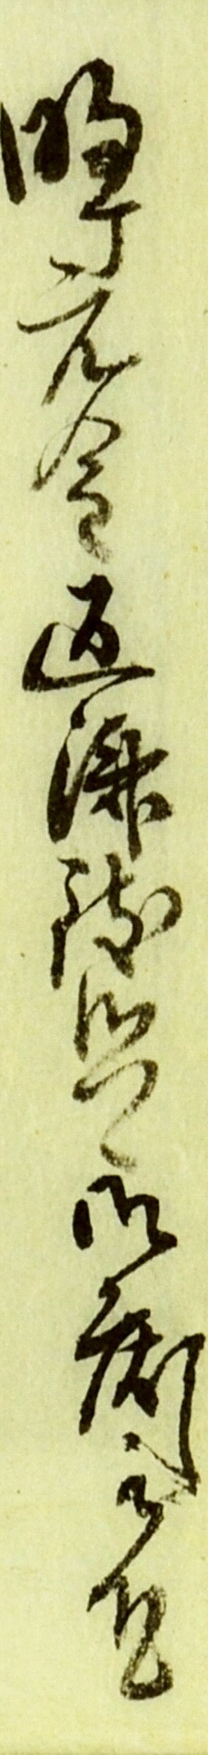明ケ元金返済致候ハヽ御戻し被下候
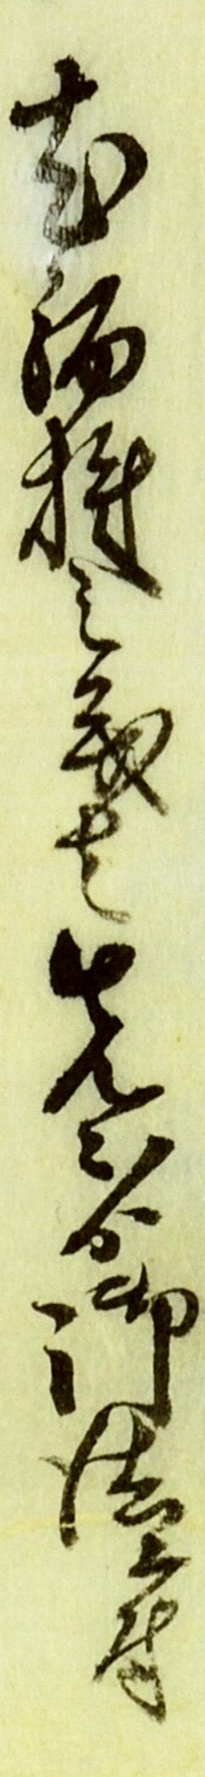尤酒株之義者先々ゟ御法ニ付
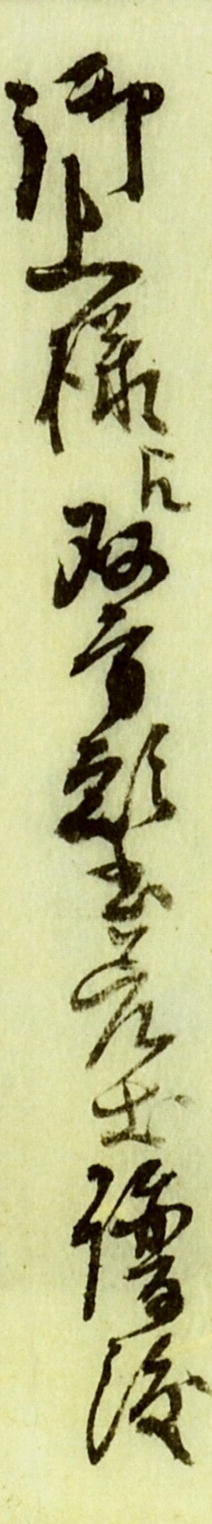御上様江双方願書差出譲渡
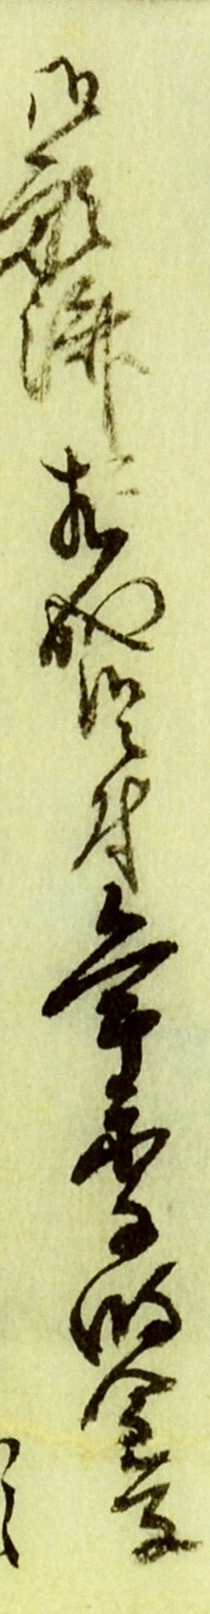御願済相成候ニ付年季明金子
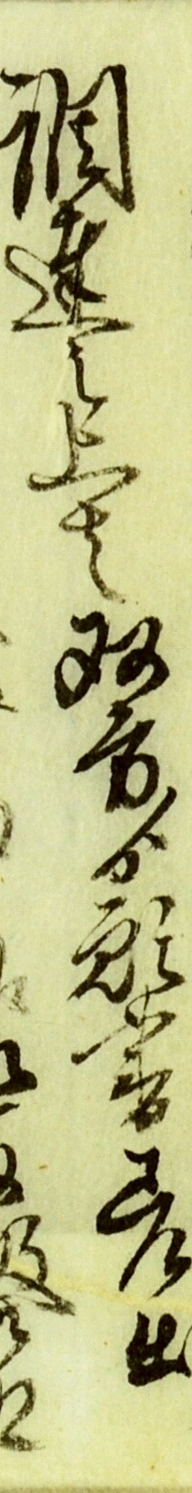調達之上者双方ゟ願書差出し
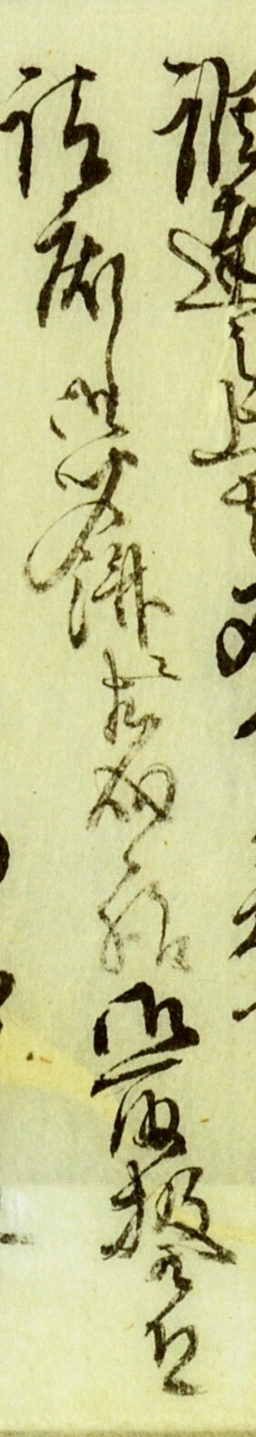請戻し御聞済ニ相成候様御取扱被下候
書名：造酒株一件始末
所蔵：伊那市立高遠町図書館・合同会社AMANE
